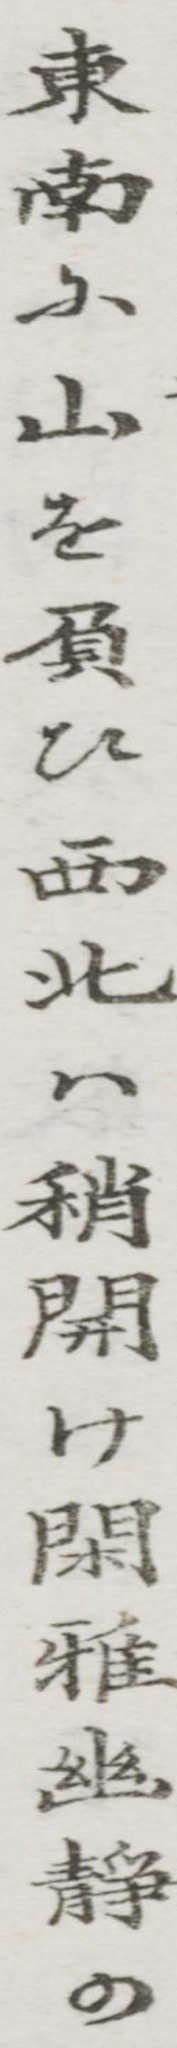東南に山を負ひ西北は稍開け閑雅幽静の
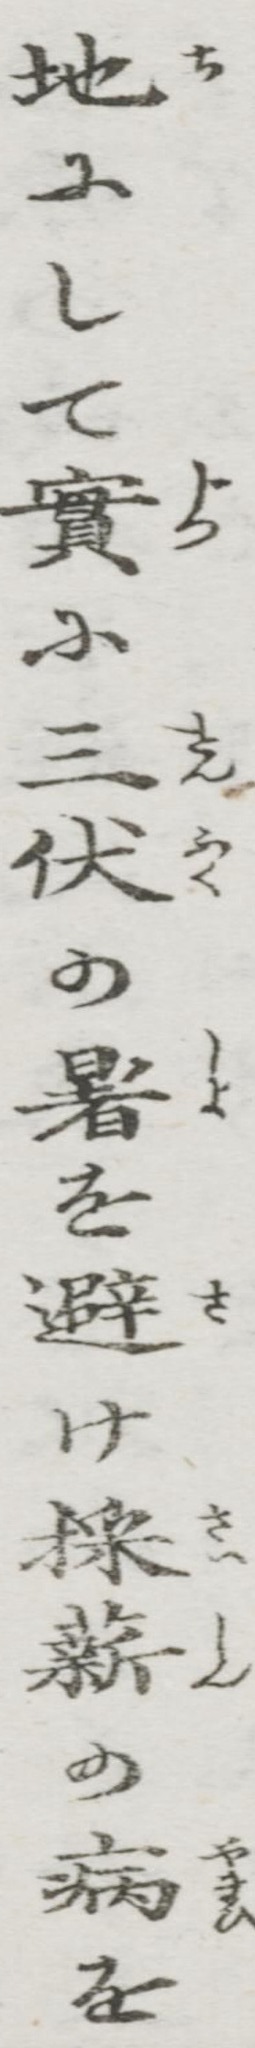地にして實に三伏の暑を避け採薪の病を
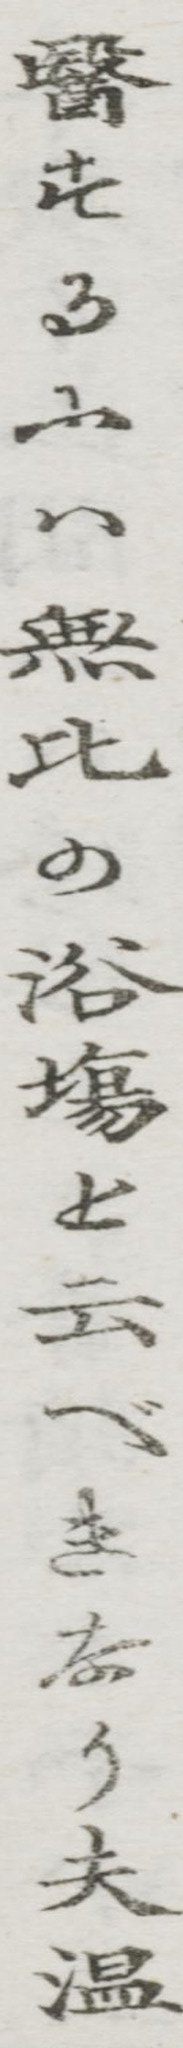醫するには無比の浴場と云べきなり夫温
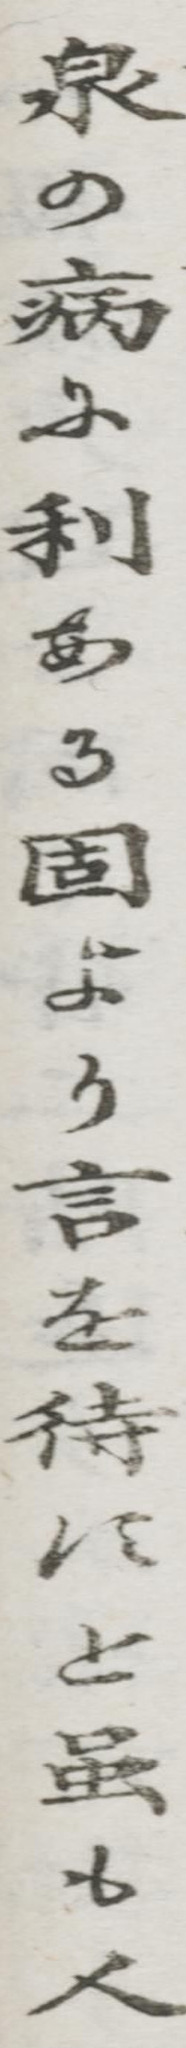泉の病に利ある固より言を待すと雖も人
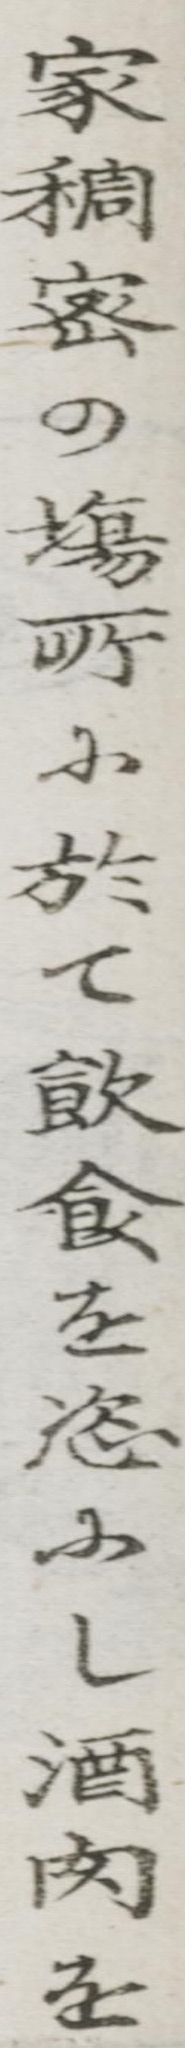家稠密の場所に於て飲食を恣にし酒肉を
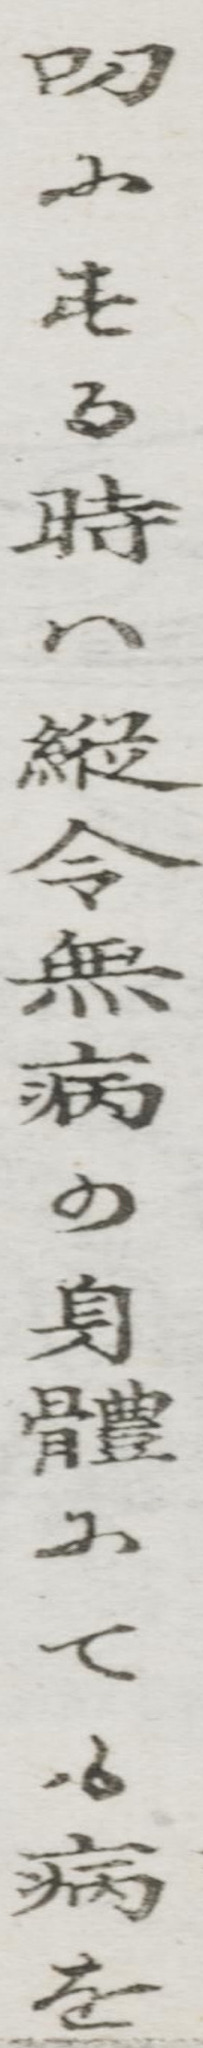叨にする時は縦令無病の身體にても病を
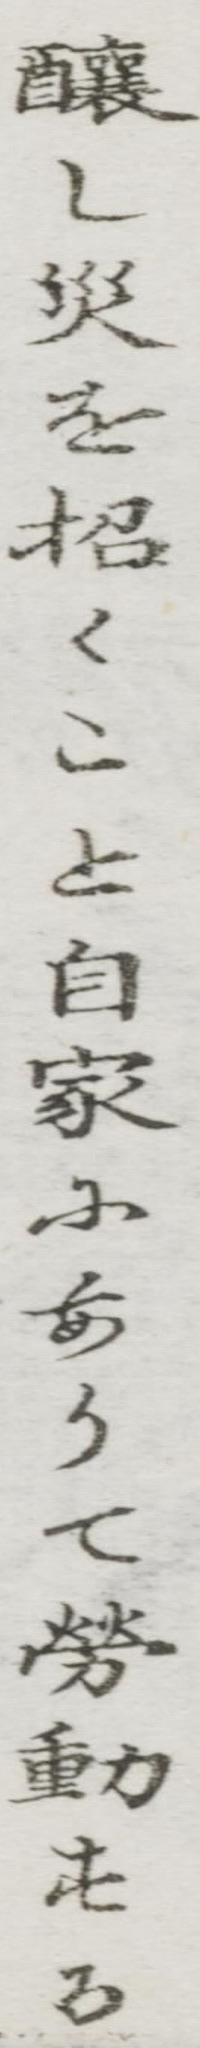醸し災を招くこと自家にありて勞動する
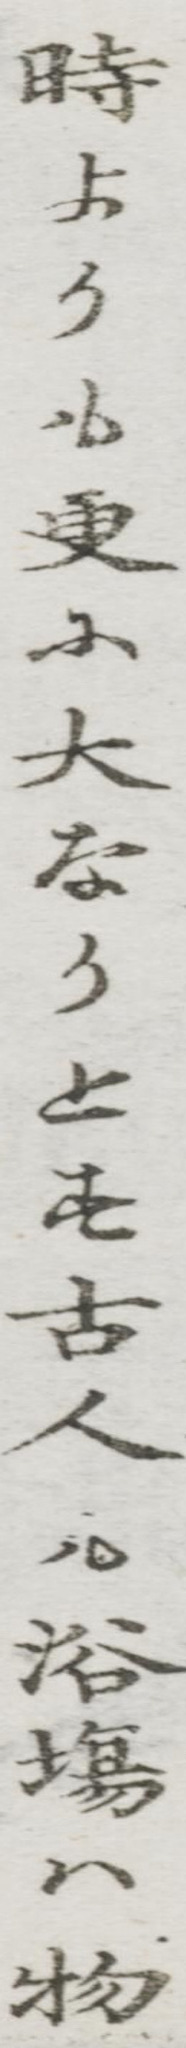時よりも更に大なりとも古人も浴場は物
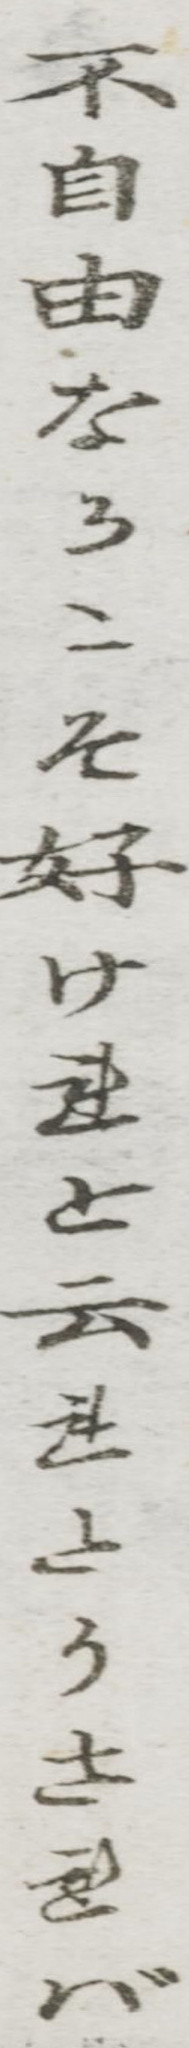不自由なるこそ好けれと云れたりされば
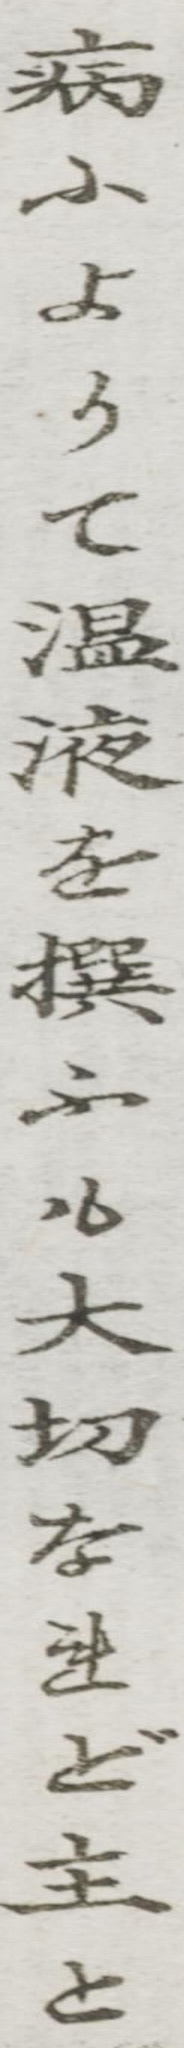病によりて温液を撰ふも大切なれど主と
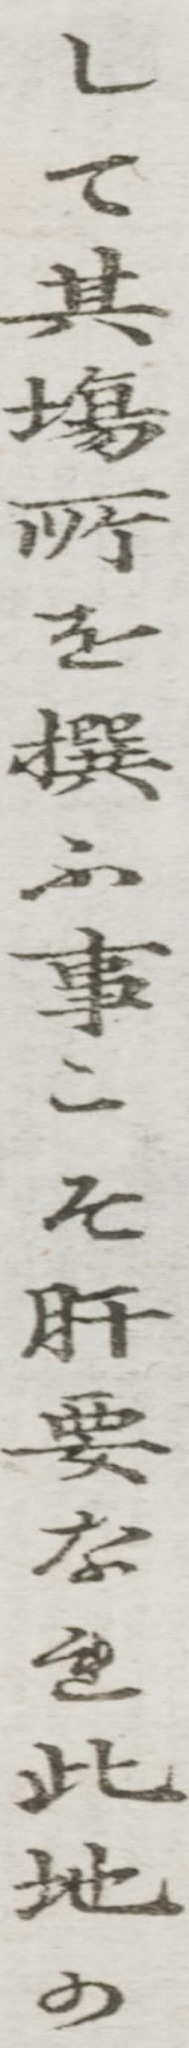して其場所を撰ふ事こそ肝要なれ此地の
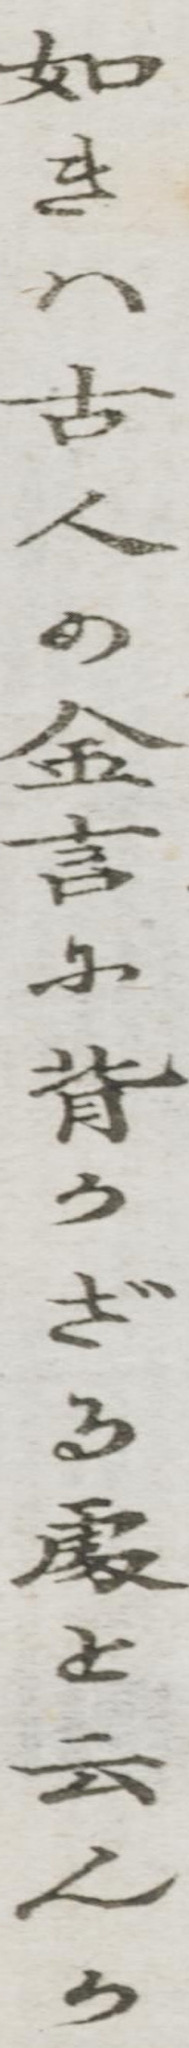如きは古人の金言に背かざる處と云んか

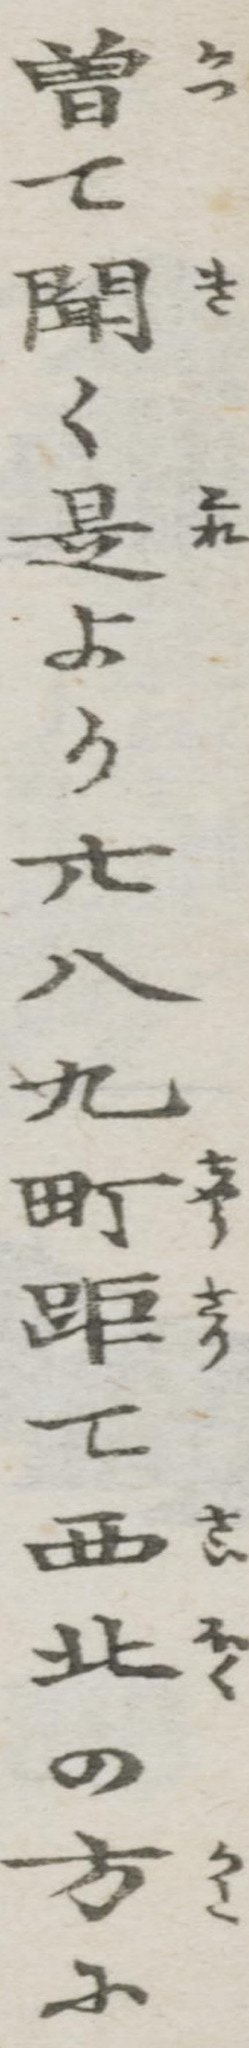曾て聞く是より廿八九町距て西北の方に
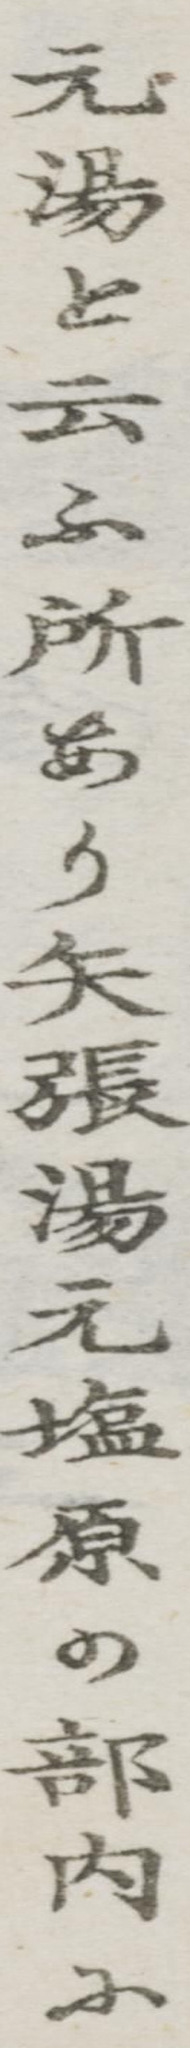元湯と云ふ所あり矢張湯元塩原の部内に
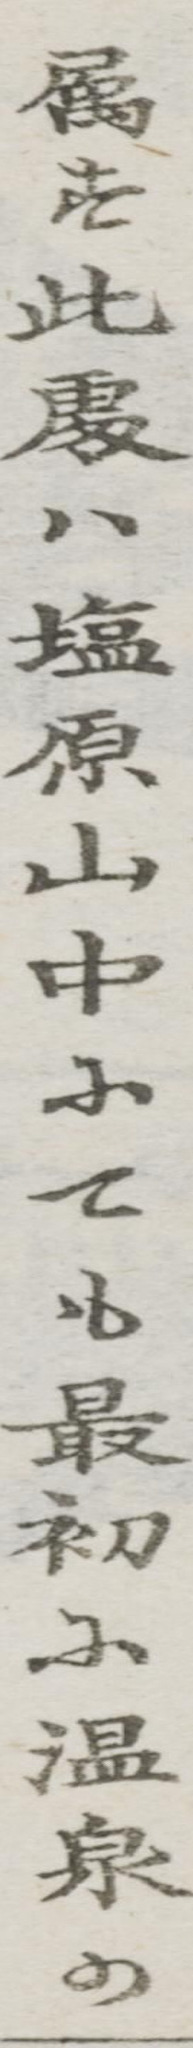属す此處は塩原山中にても最初に温泉の
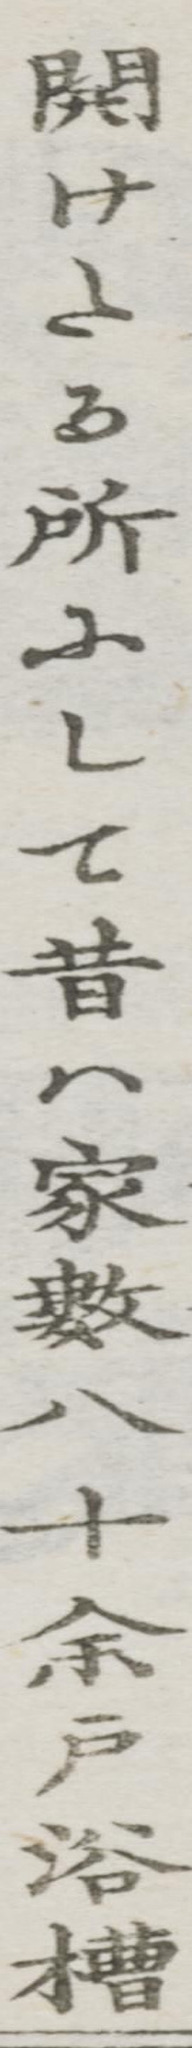開けたる所にして昔は家数八十余戸浴槽
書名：塩原繁昌記　全
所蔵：東京大学地震研究所図書室 Earthquake Research Institute Library, The University of Tokyo, JAPAN
